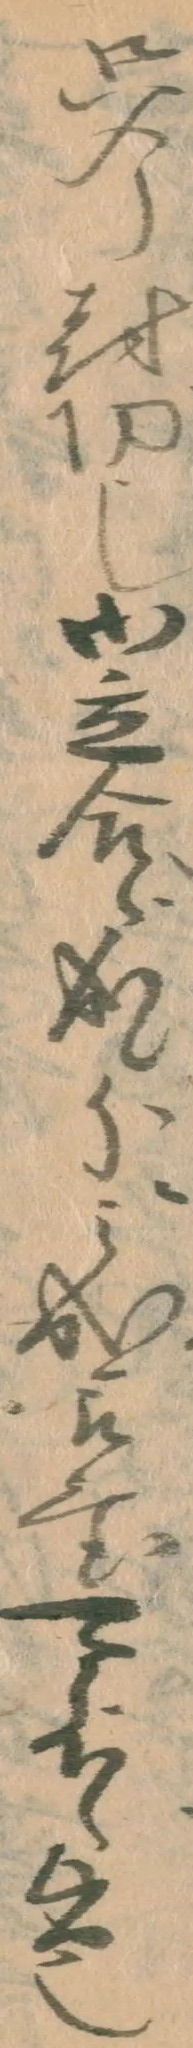只今封切申候御立合被成候分ニ被成被置可被下候旨也
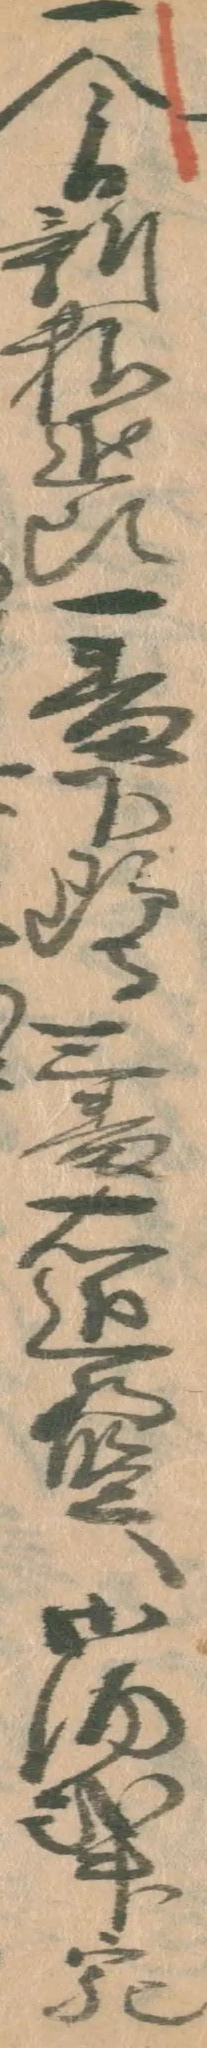一今日新精進頭一番下野守三番右近将監へ御酒弐升宛
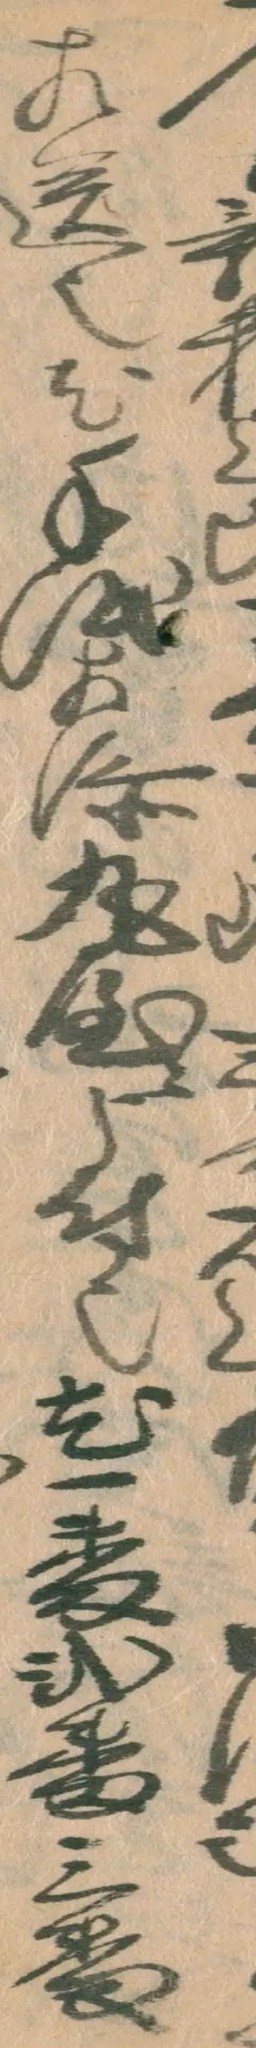相送也尤手紙相添丸屋ニ申付也尤一番弐番三番
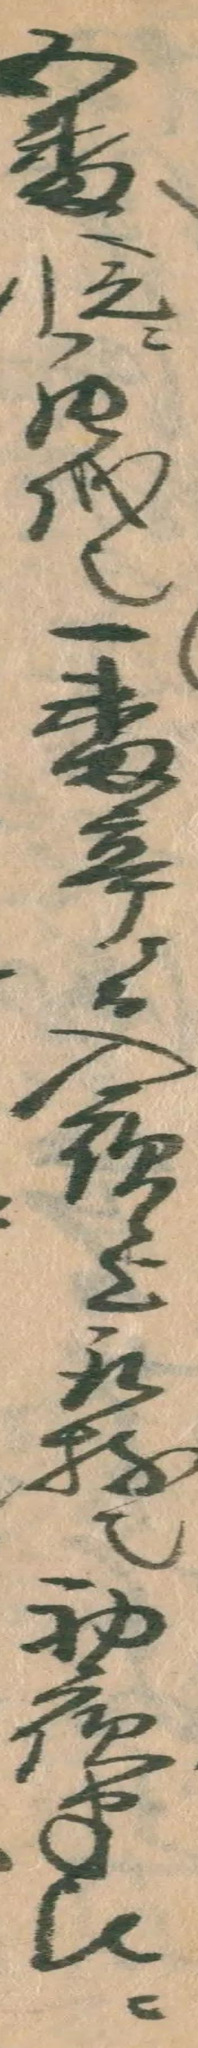五番へ悦ニ罷越也一番亭ニ而入夜之上取揃也初夜半頃ニ
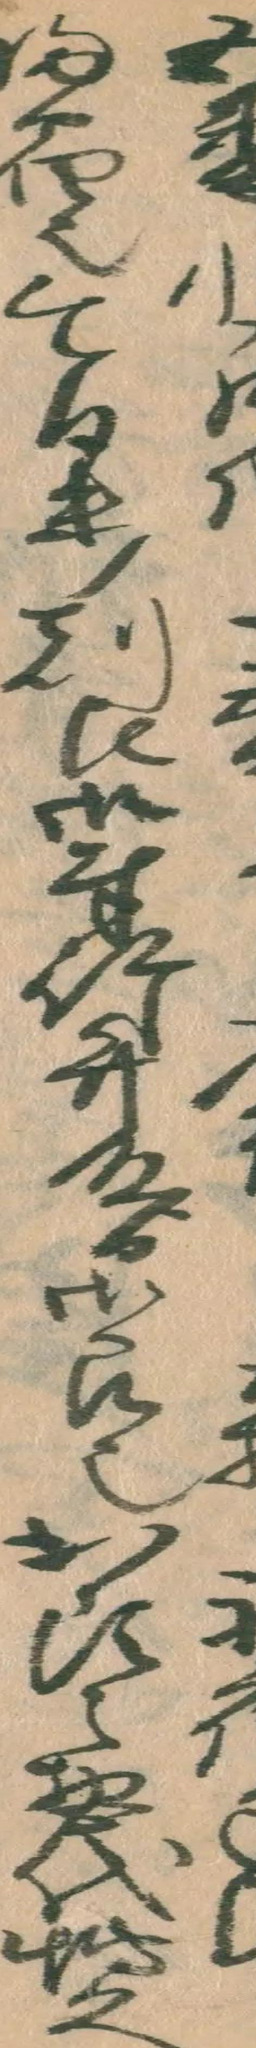帰宿也今日未ノ刻頃御奉行弁殿ゟ御召也出頭之惣代博久
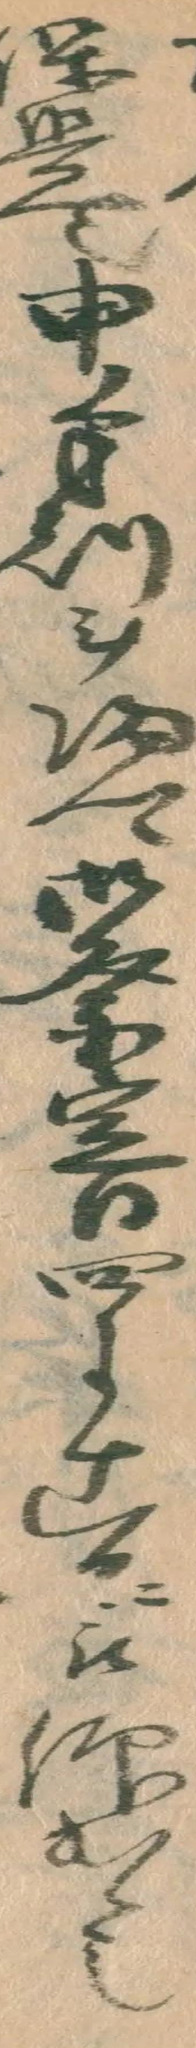保覚也申ノ半刻計帰郷御祭定日四月十八日ニ被仰出候也
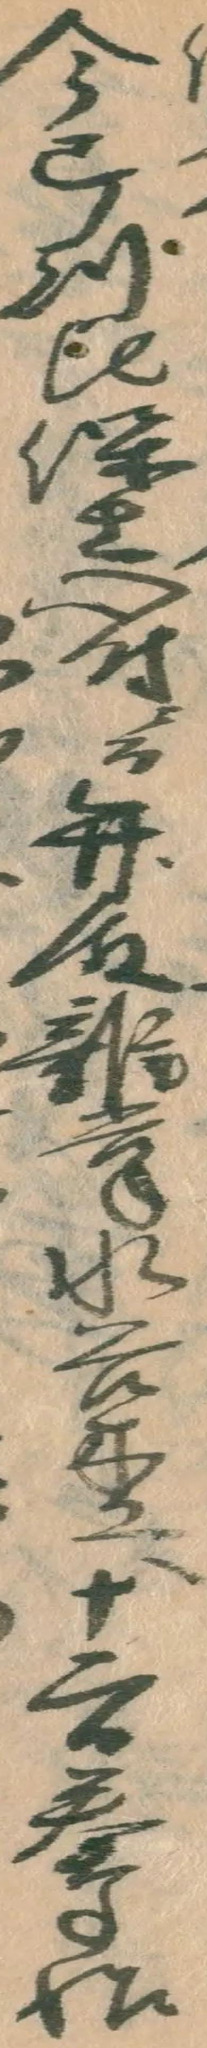今巳ノ刻頃保土心付ニ而弁殿雑掌水谷木工へ十二日奏事始
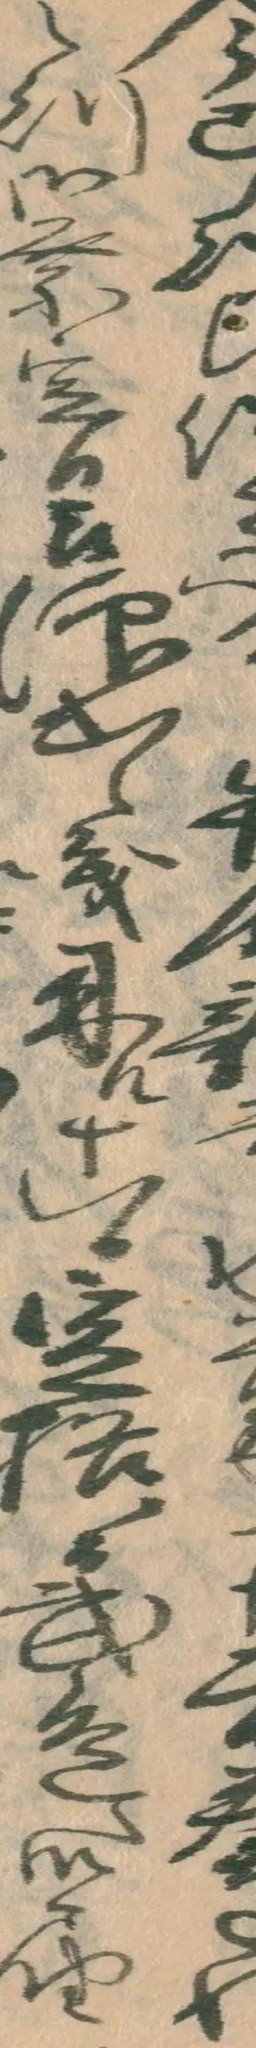之刻御祭定日被仰出候義来ル十八日定格ニ而武辺へ御届
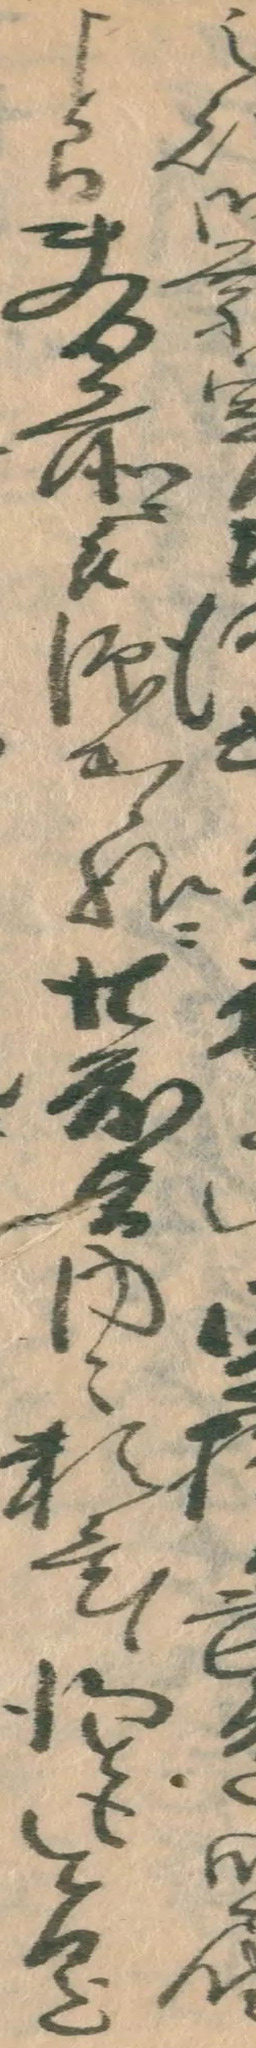申候間夫ゟ前ニ被仰出候様二仕度旨内々頼置候得とも今日迄
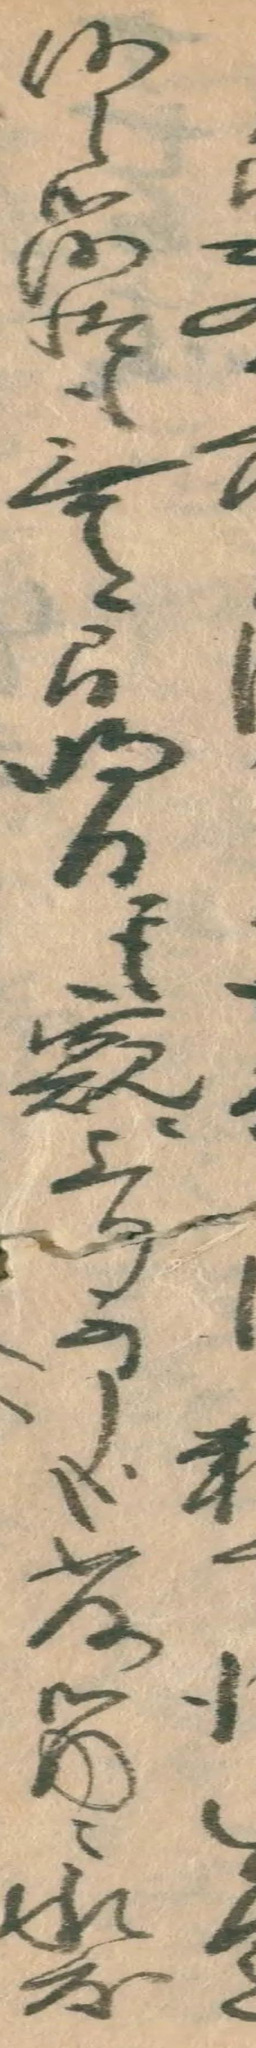何之御沙汰も無之候間明日ニも窺ニ上り可申哉如何御内々承度
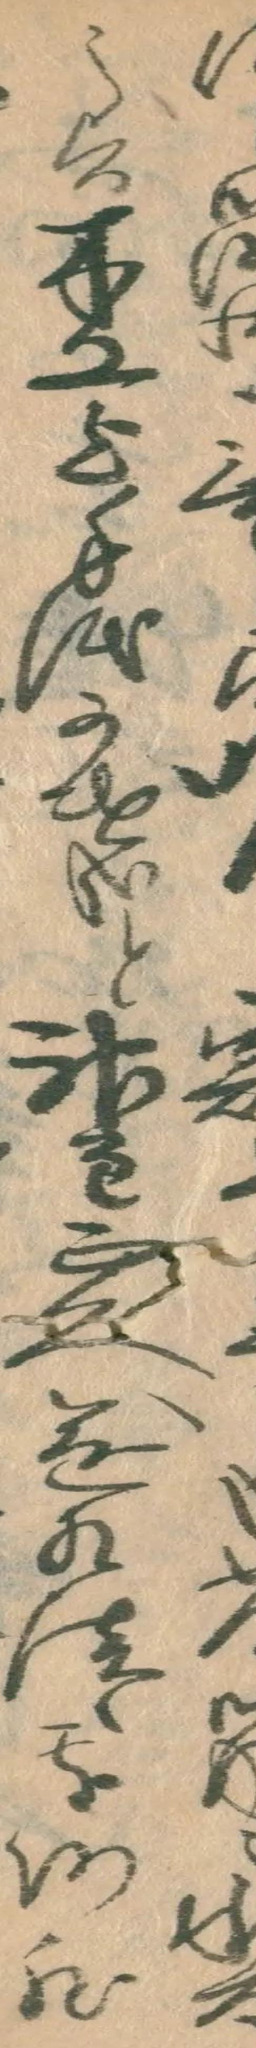之旨木工迄手紙可遣哉と神主正久へ遂相談候其故歟
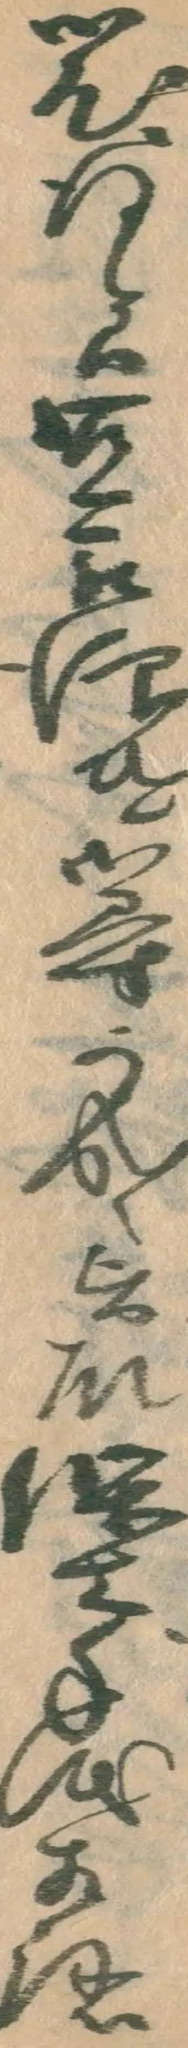御心得候間召被仰出候御尋可成之旨故保土手紙相認
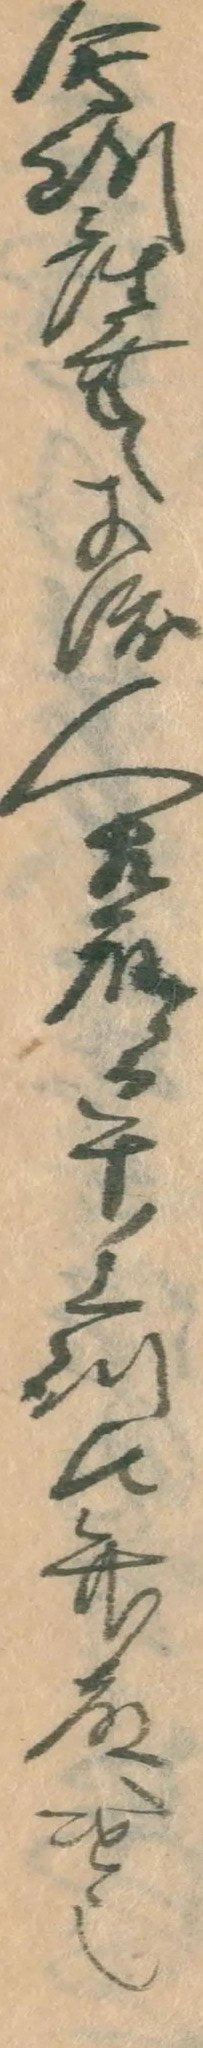会所産幸へ相渡人相衆ニ而午ノ上刻比弁殿へ遣也

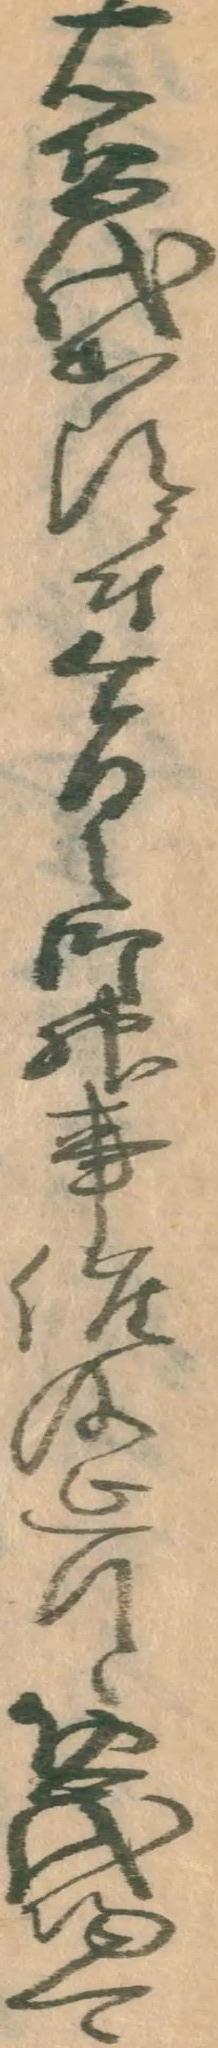右惣代出頭ニ付今日之御神事催及延引候惣代帰て
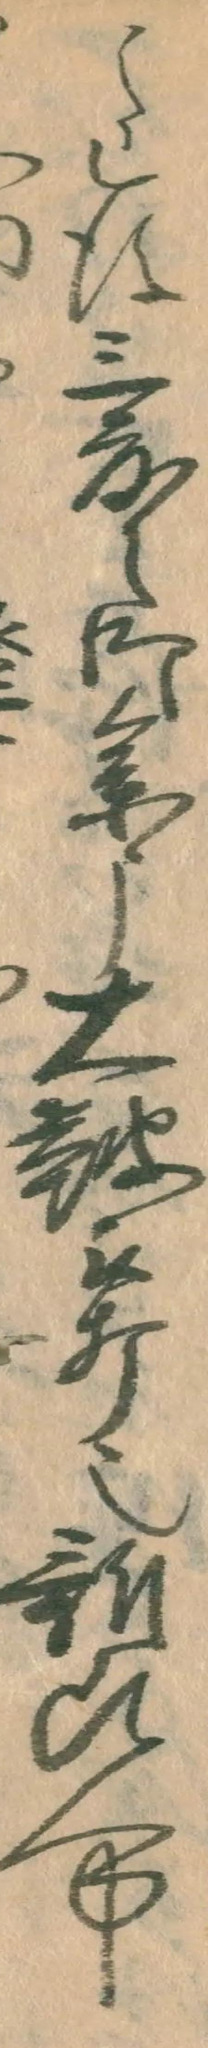之已後三度之御参申大鼓被打也新頭人中
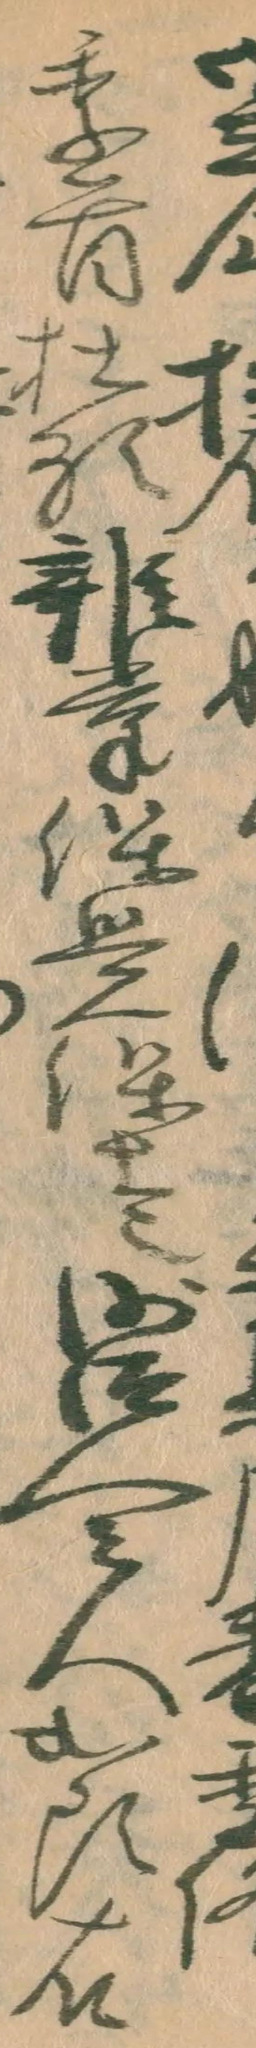季首杜顕雑掌保覚保土也沙汰人壱人出頭右
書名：賀茂社記録. 第60冊
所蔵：国立国会図書館 National Diet Library, JAPAN
